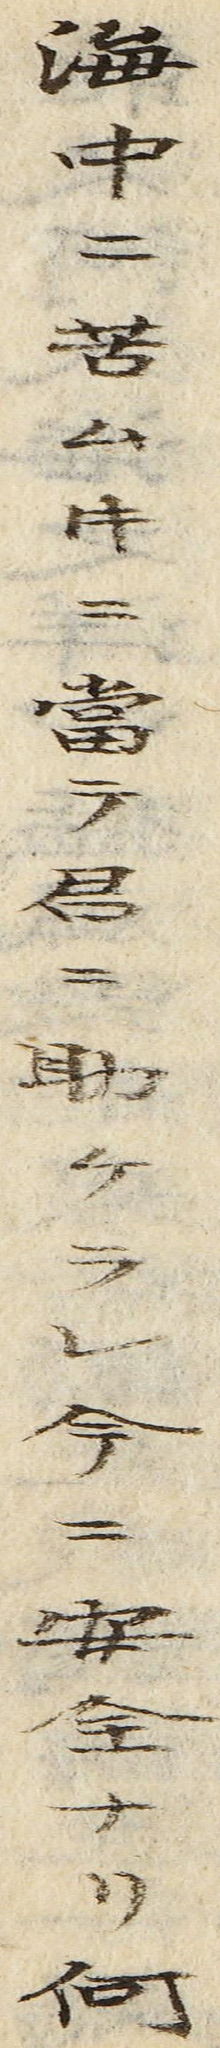海中ニ苦ムトキニ当テ君ニ助ケラレ今ニ安全ナリ何
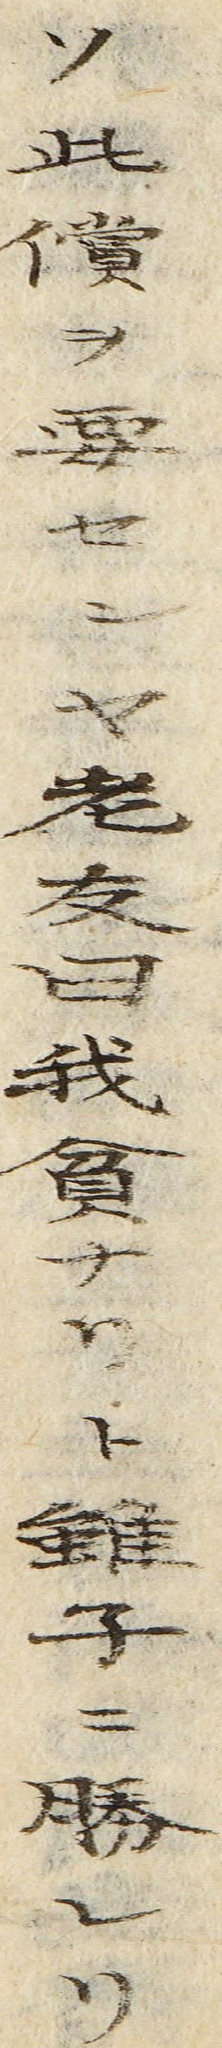ソ此償ヲ要センヤ老友曰我貧ナリト雖子ニ勝レリ
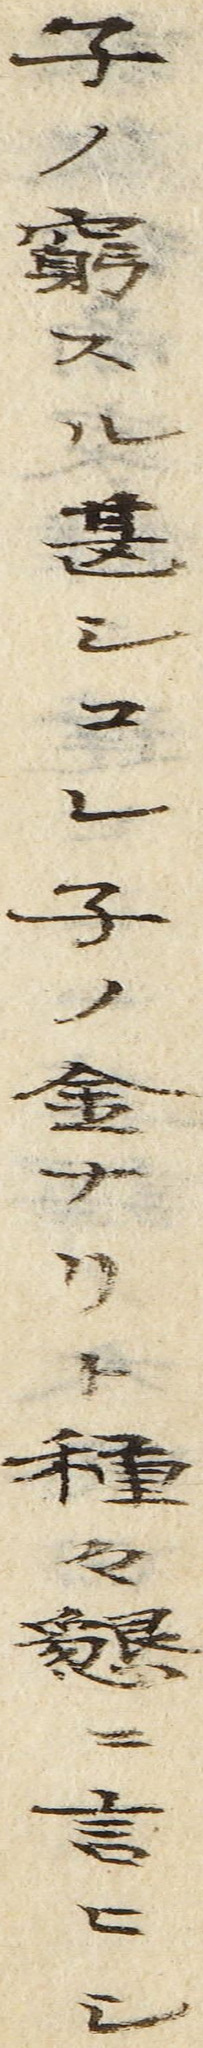子ノ窮スル甚シコレ子ノ金ナリト種々懇ニ言ヒシ
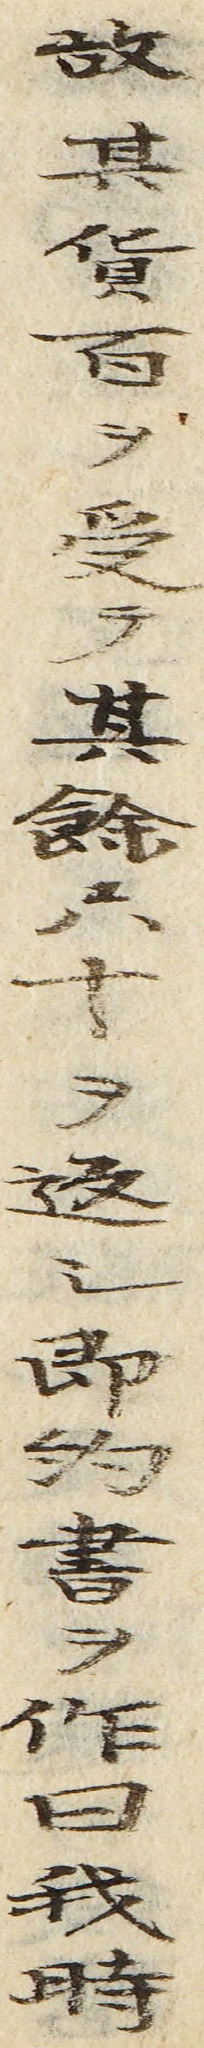故其貨百ヲ受テ其余六十ヲ返シ即約書ヲ作曰我時
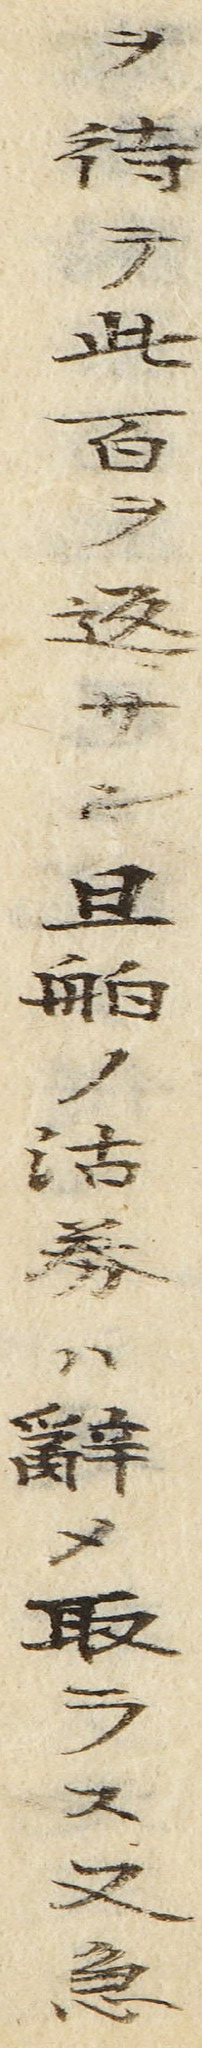ヲ待テ此百ヲ返サン且舶ノ沽券ハ辞シテ取ラス又急

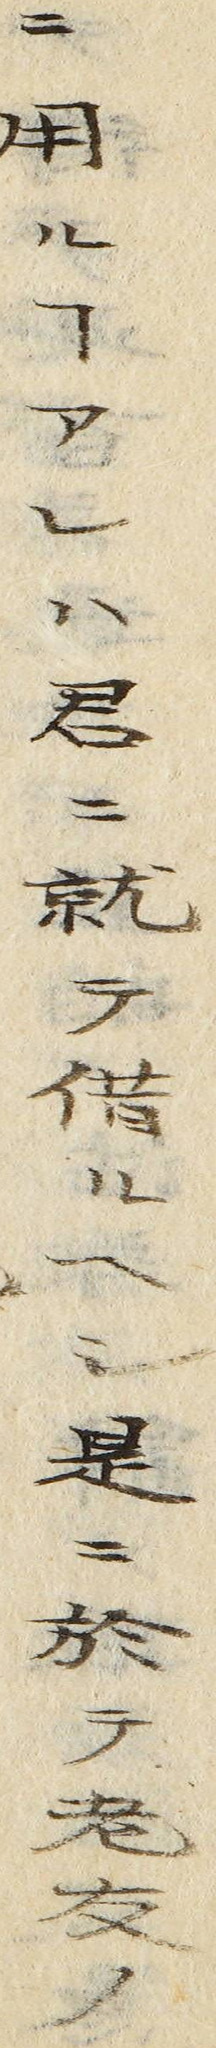ニ用ルコトアレハ君ニ就テ借ルヘシ是ニ於テ老友ノ
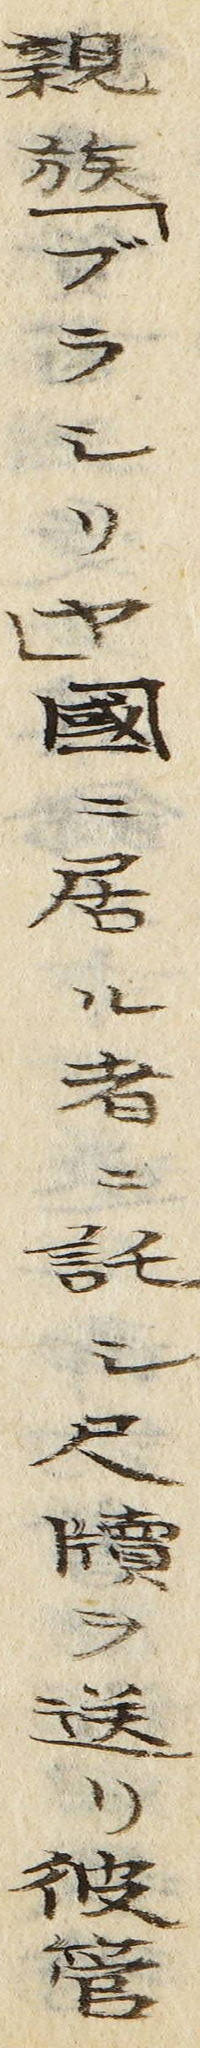親族「ブラシリヤ」国ニ居ル者ニ託シ尺牘ヲ送リ彼管
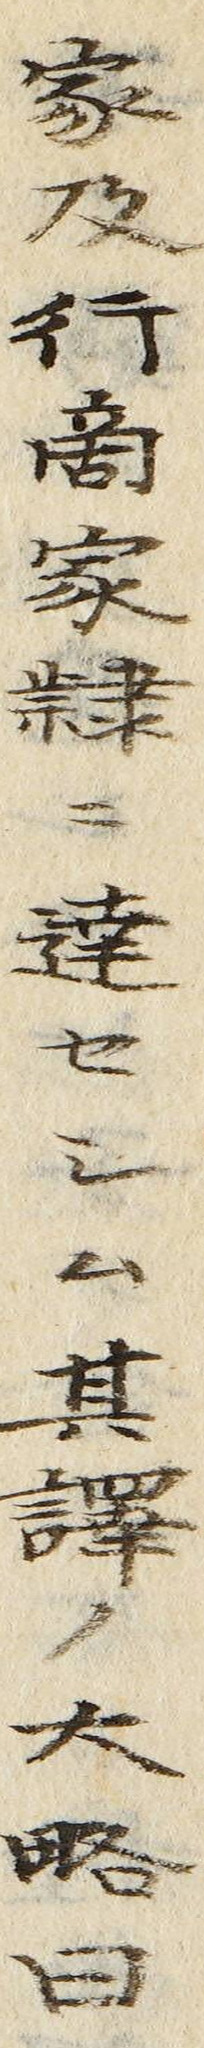家及行商家隷ニ達セシム其訳ノ大略曰
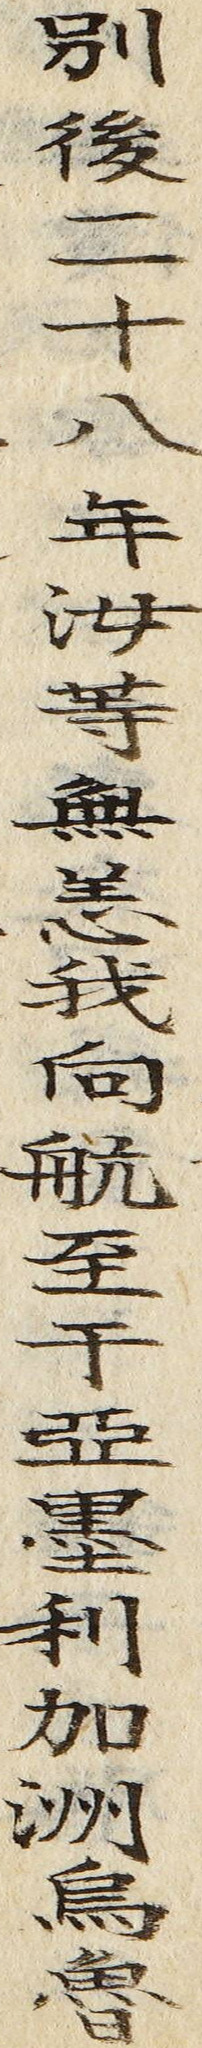別後二十八年汝等無恙我向航至千亜墨利加洲烏魯
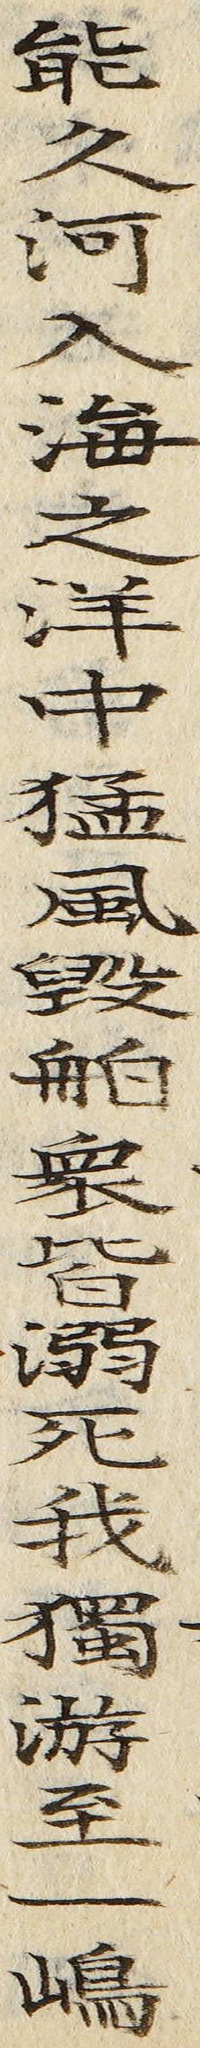能久河入海之洋中猛風毀舶衆皆溺死我獨游至一嶋
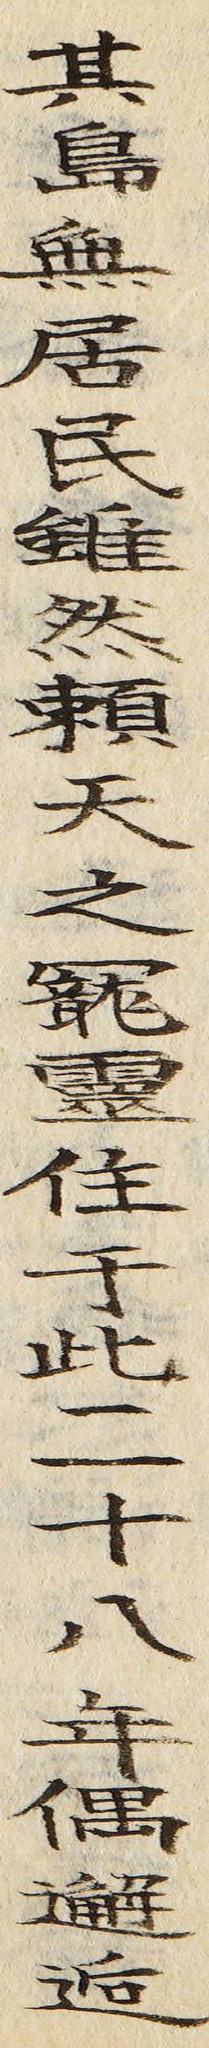其島無居民雖然頼天之寵霊住于此二十八年偶邂逅
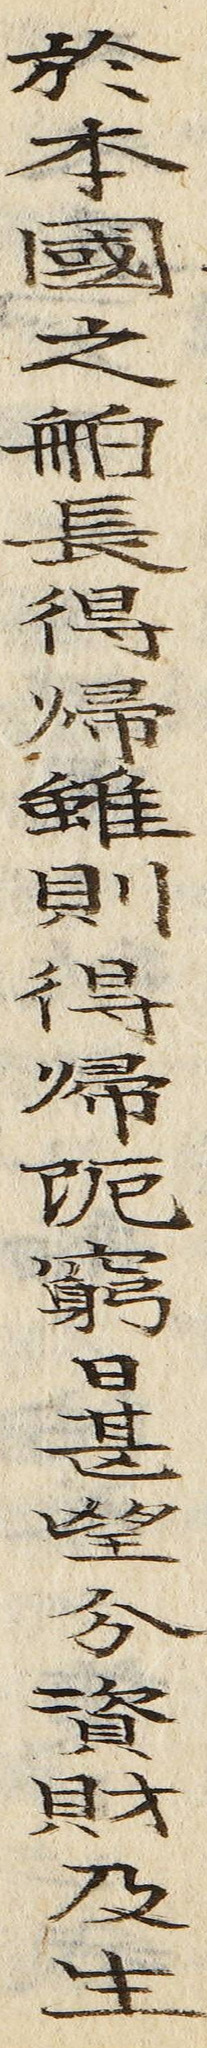於本国之舶長得帰雖則得帰阨窮日甚望分資財及生
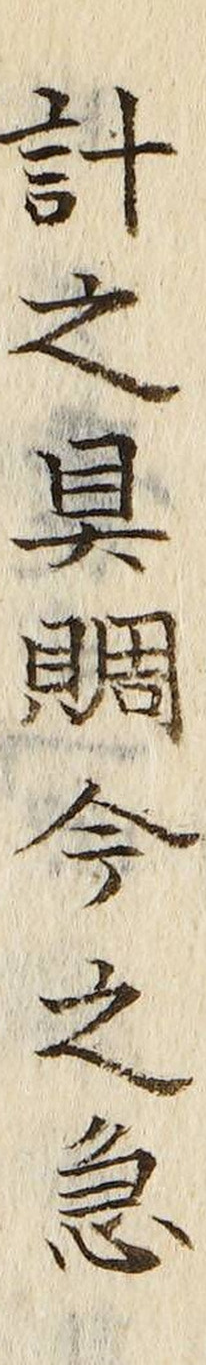計之具賙今之急
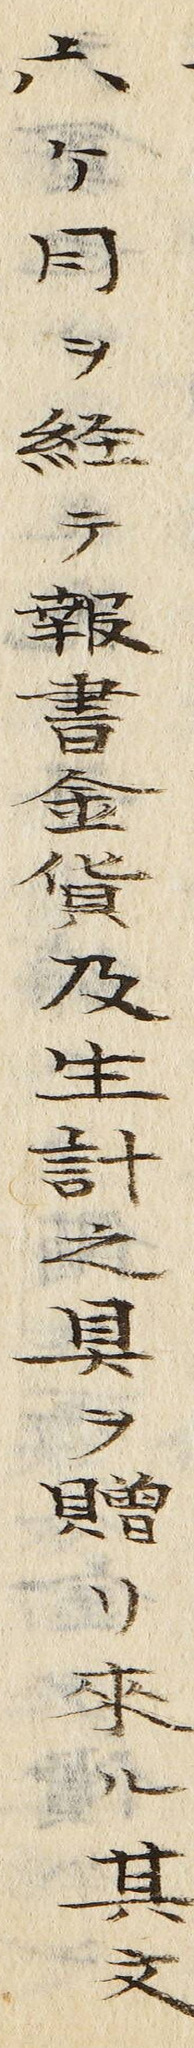六ケ月ヲ経テ報書金貨及生計之具ヲ贈リ来ル其文
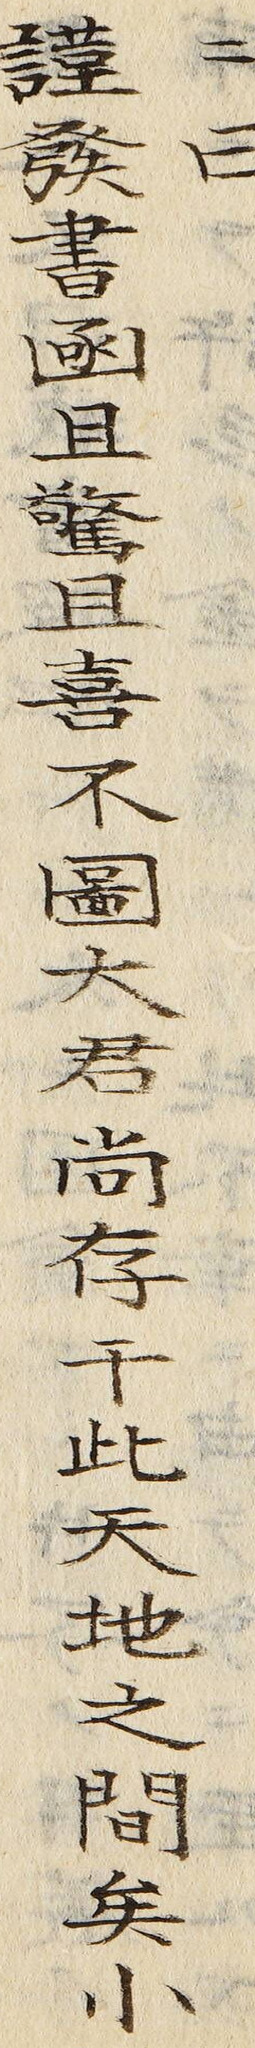謹発書函且驚且喜不図大君尚存于此天地之間矣小
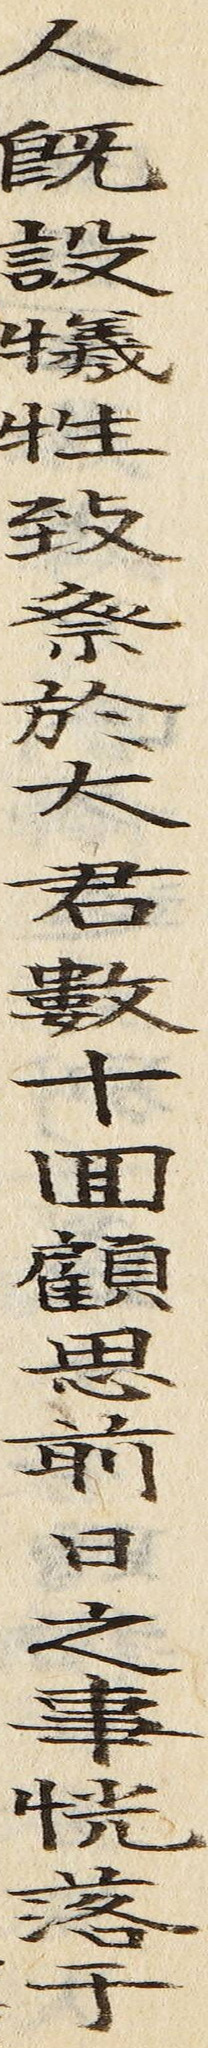人既設犠牲致祭於大君数十回顧思前日之事恍落于
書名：漂流紀事
